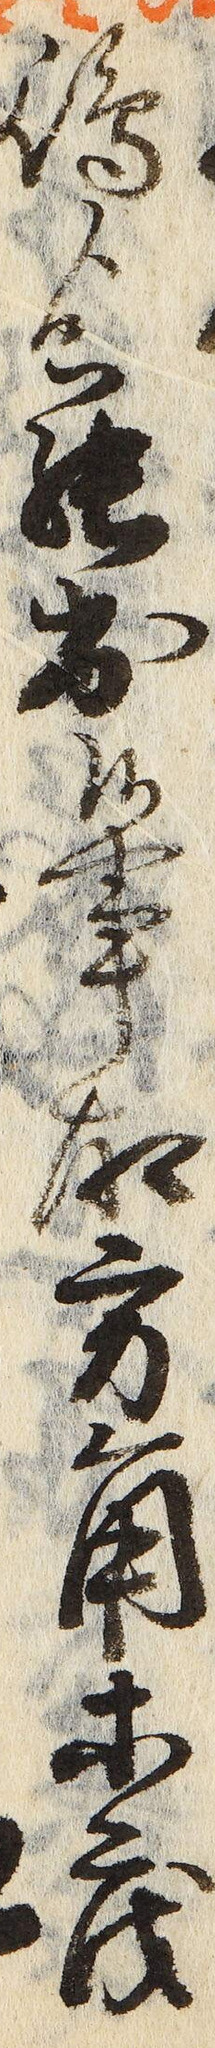嶋ゟ罷出候事故方角等も
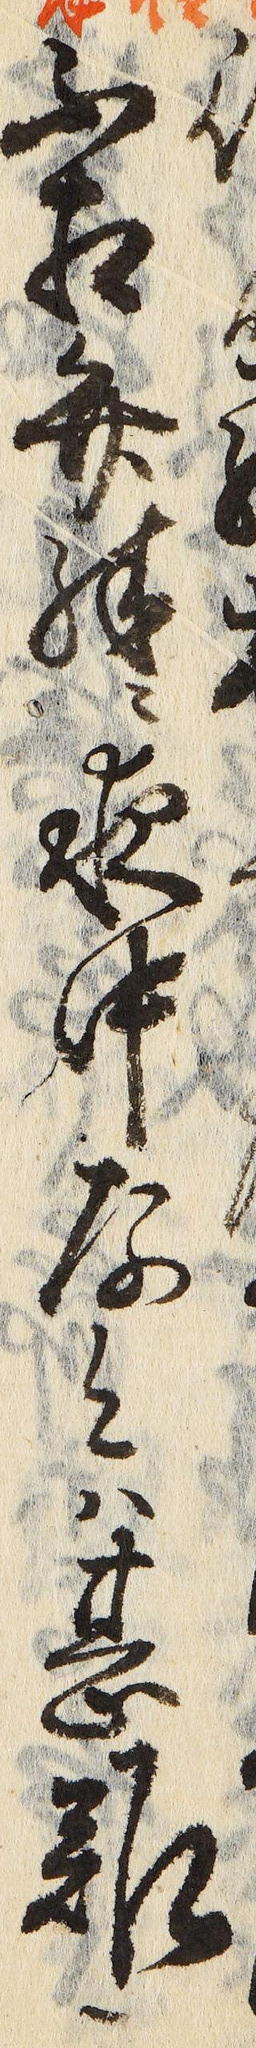不相弁殊ニ夜中なとハ甚難
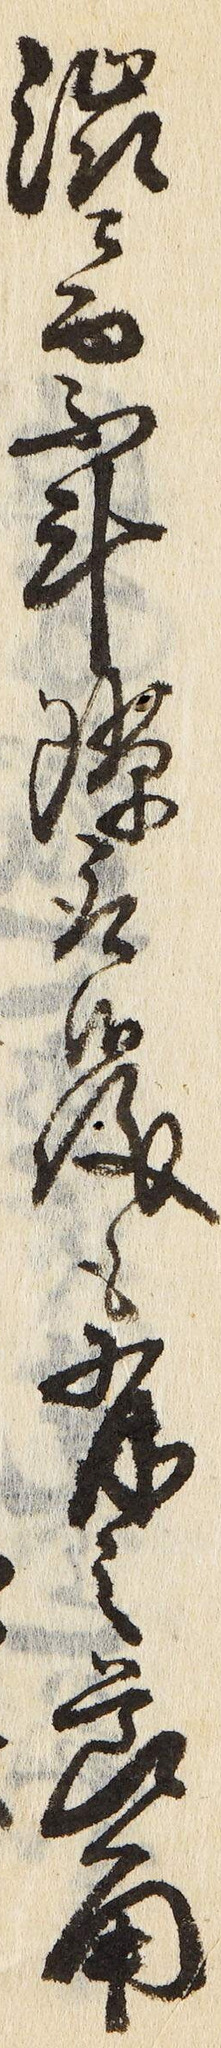渋ニ而不計隙取候儀も有之節角
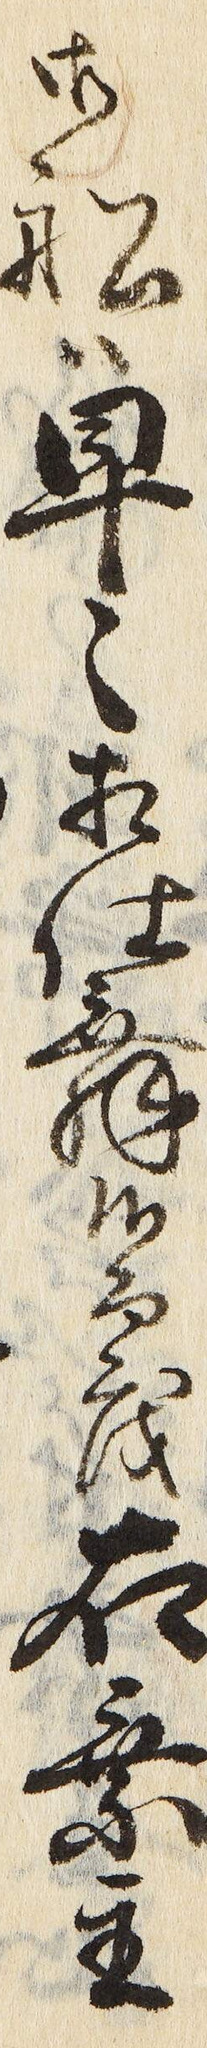御船ハ早々相仕舞候而も右乗主
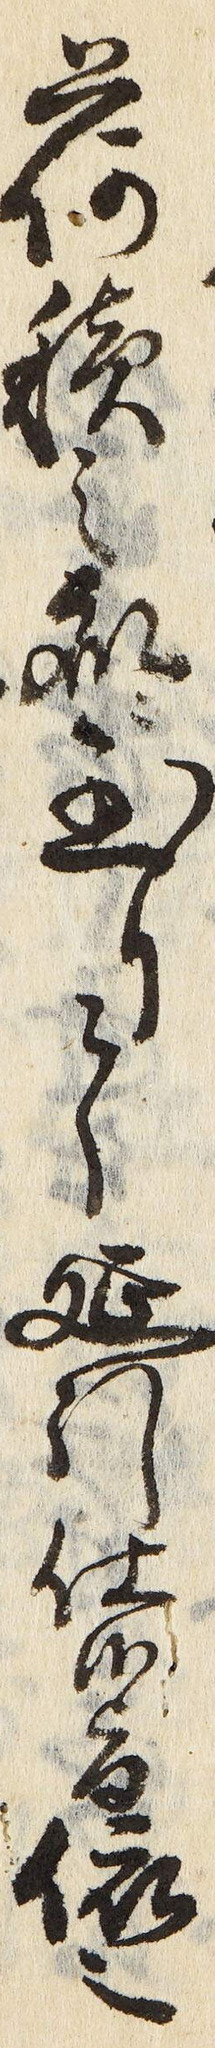荷積之処ニ至りて延引仕候旨依之
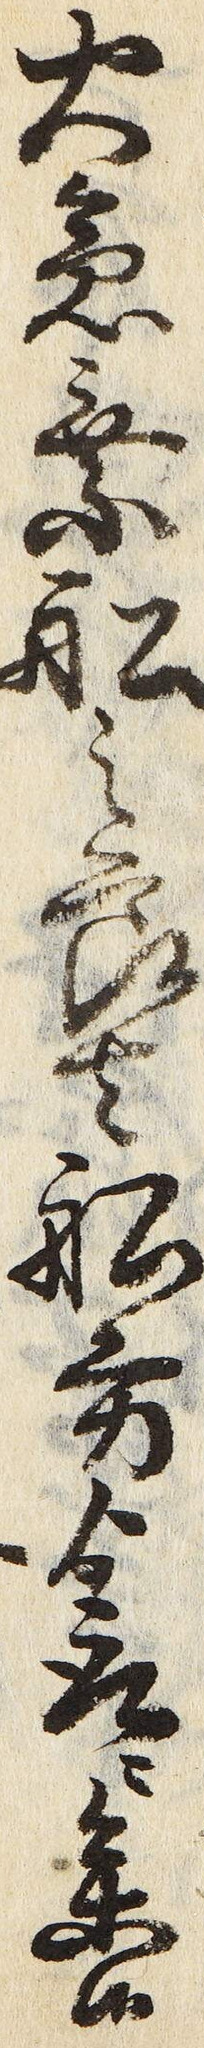火急乗船之節者船方ゟ取ニ参候
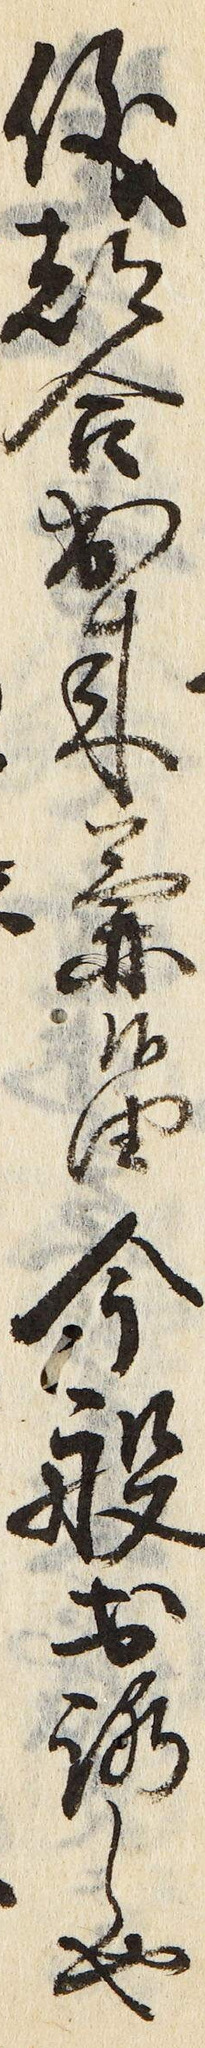儀都合出来兼候由今般おろしや
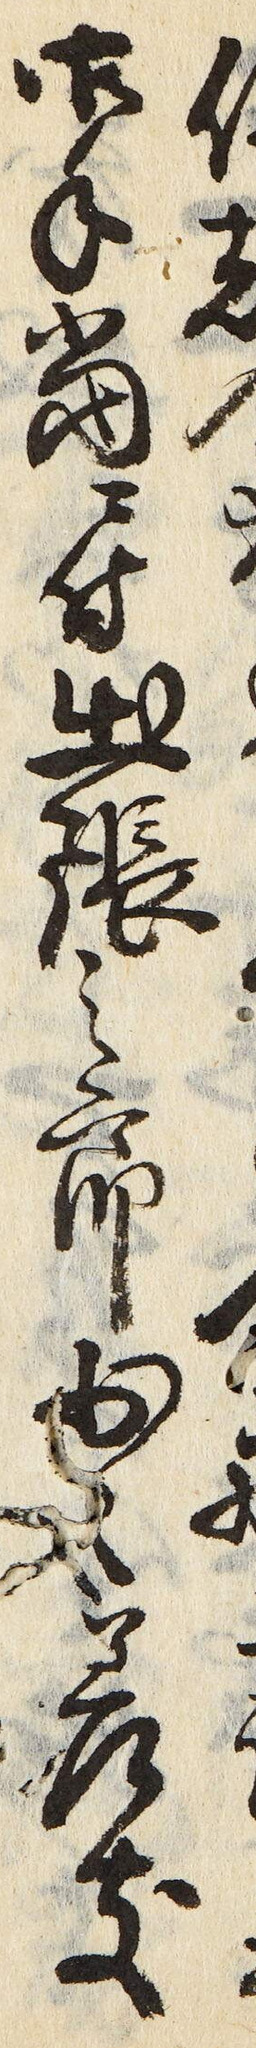御手当ニ付出張之節少差支
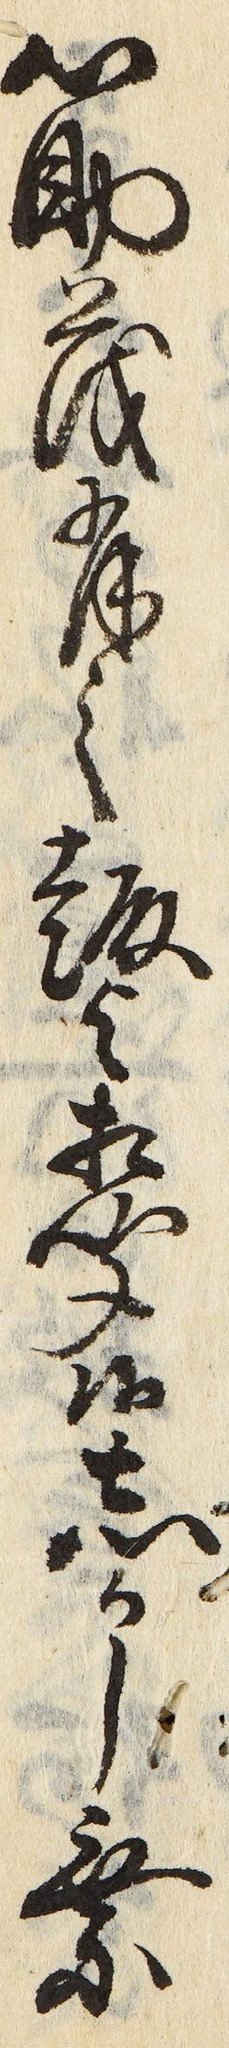筋も有之趣与相聞候しかし乗

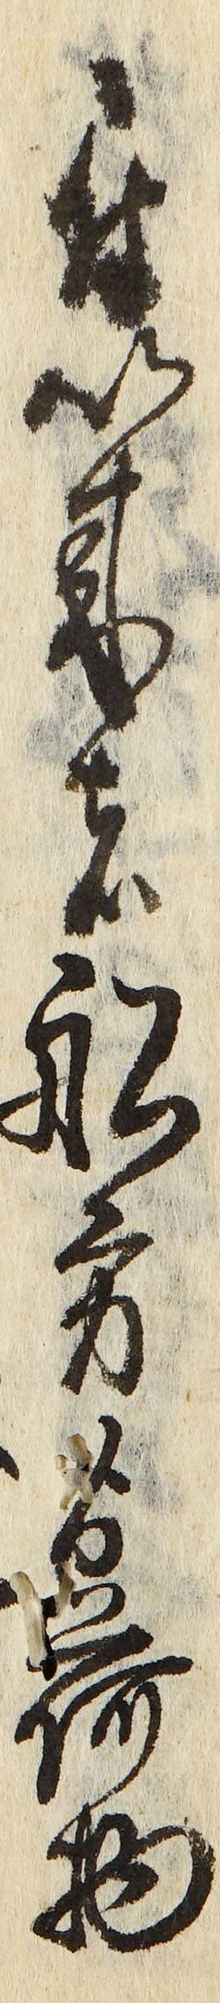ニ付以来者船方ゟ荷物
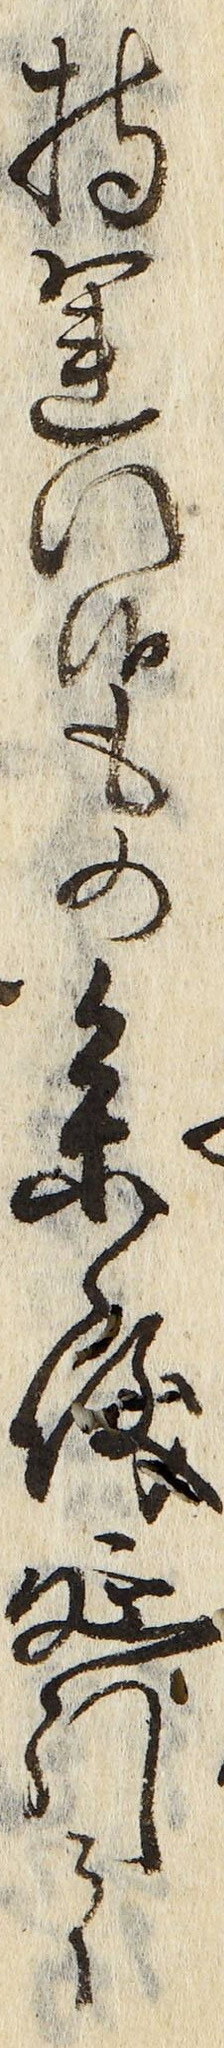持運ひ候もの参候儀延引之
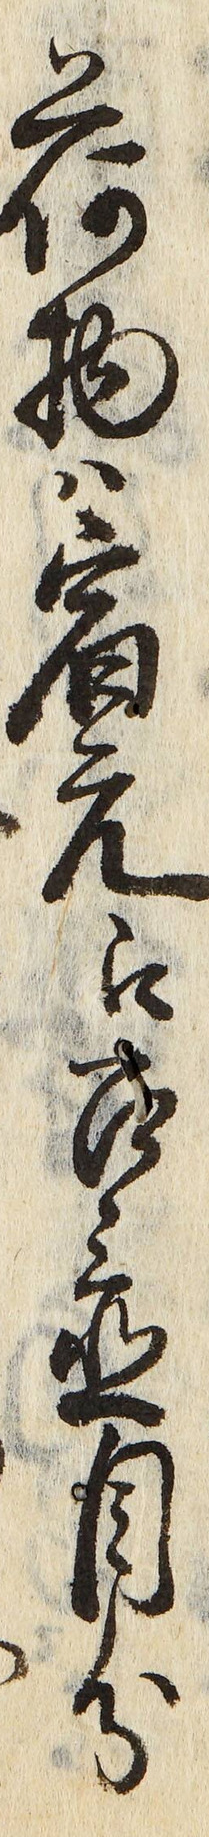荷物ハ宿元江取置自分
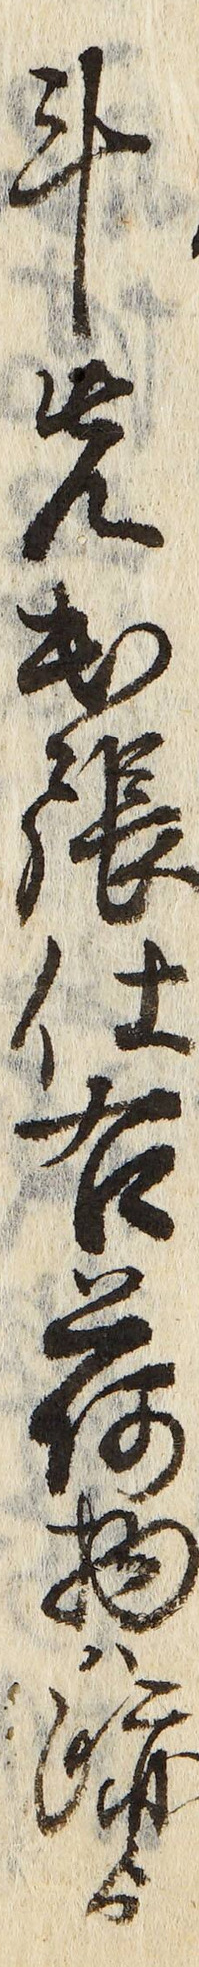斗先出張仕右荷物ハ跡ゟ
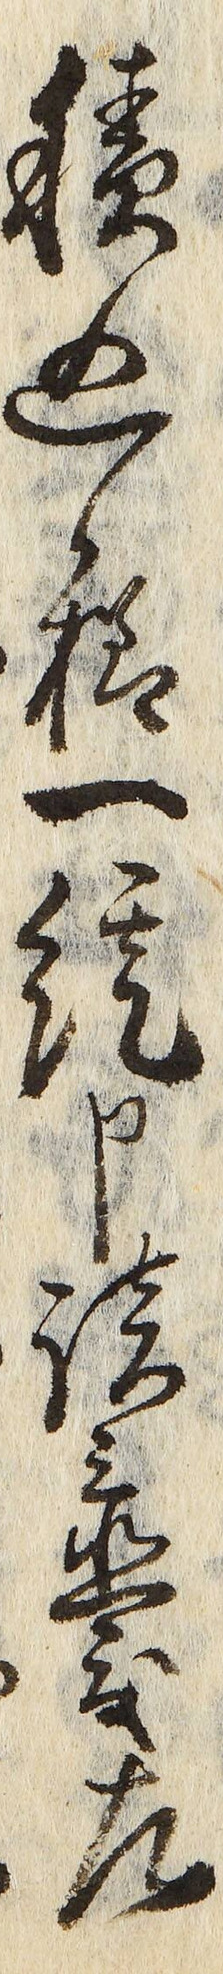積込候様一統申談置度左
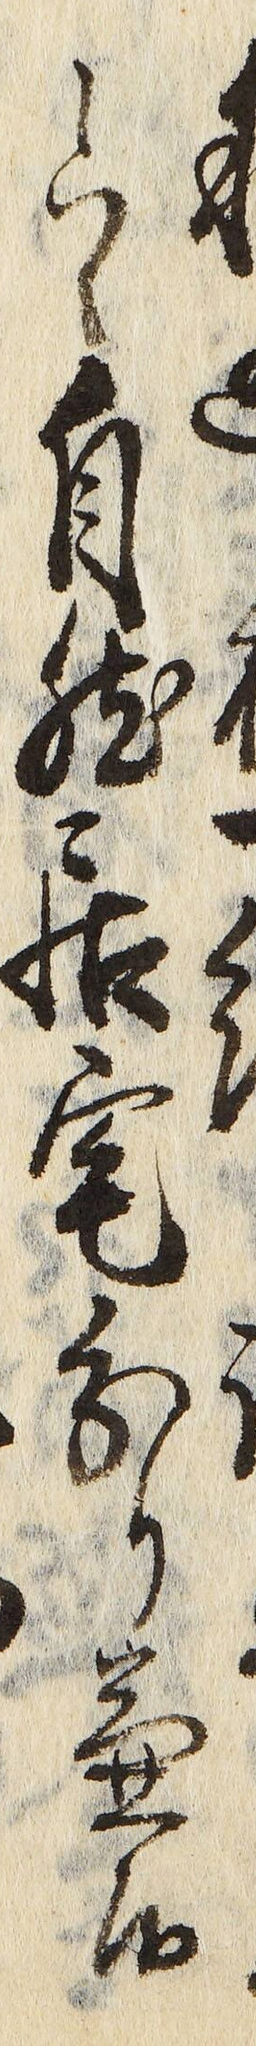候ハヽ自然居宅分り兼候
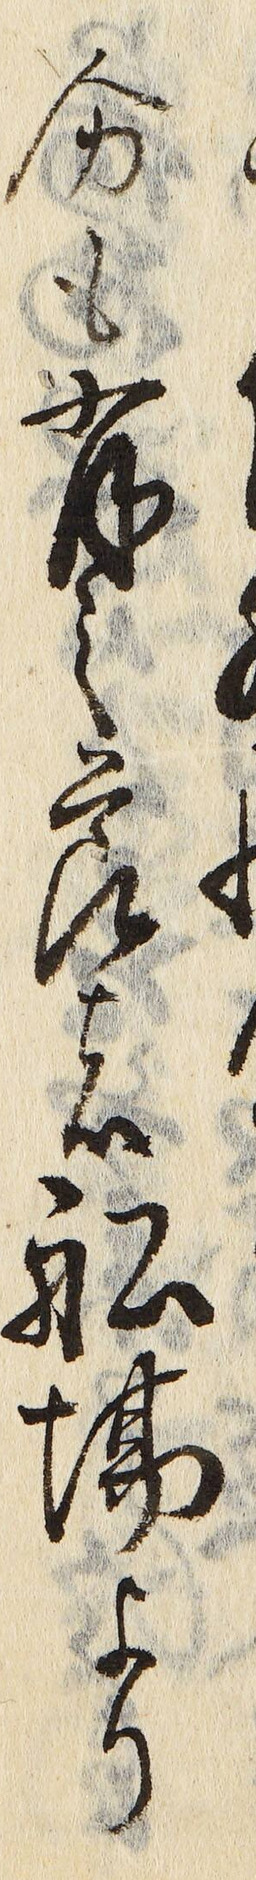分も有之節者船場より
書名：御領海江異国船漂流有之節御手当之次第大組頭心得之廉々書集記
